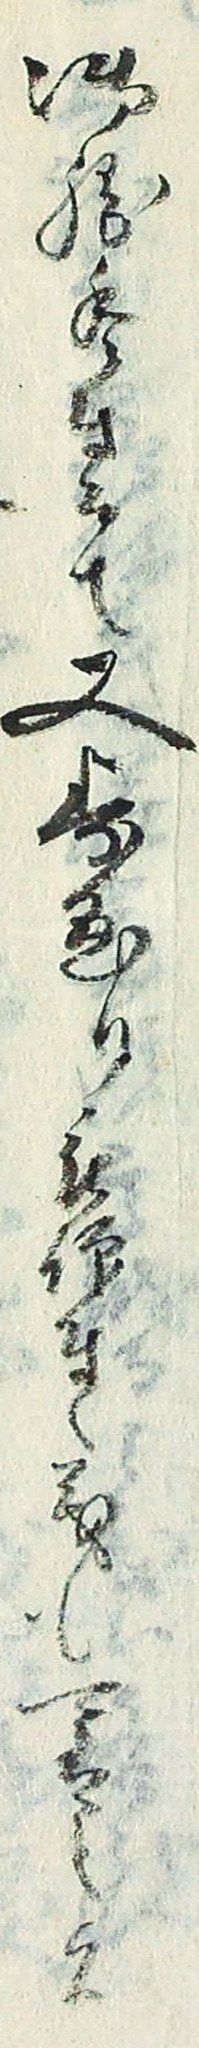御勝手ニ付候而者又歩懸り被仰付之義も可有之候
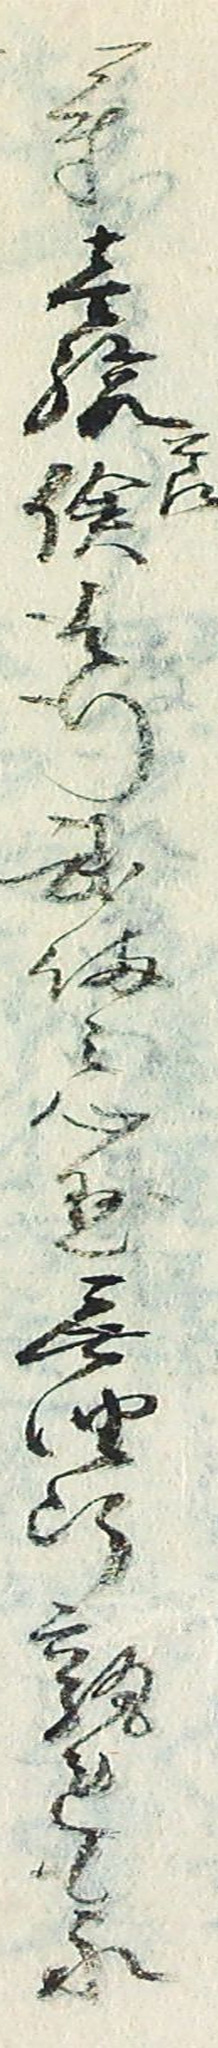ニ付壱統節倹取行武備之心懸無油断孰れも永
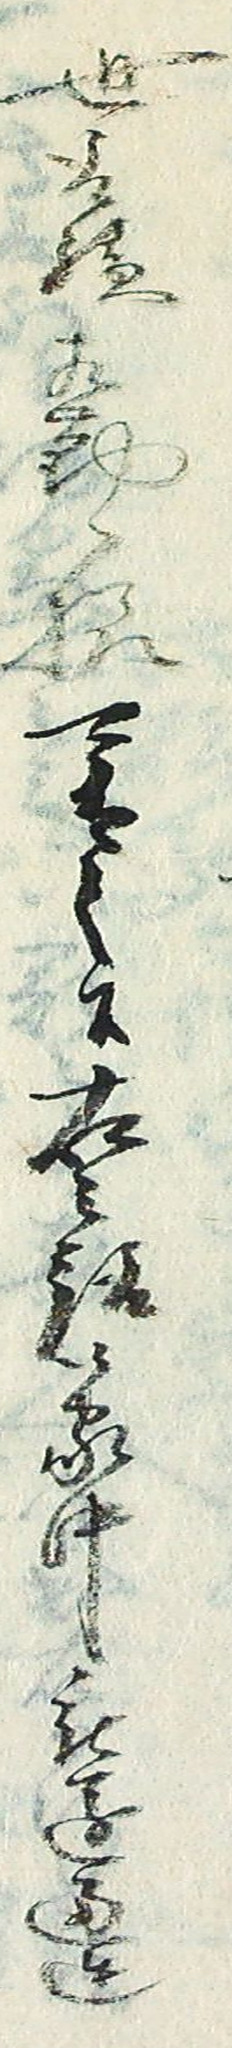世取續相勤候様可有之候右之趣御家中被遂通達
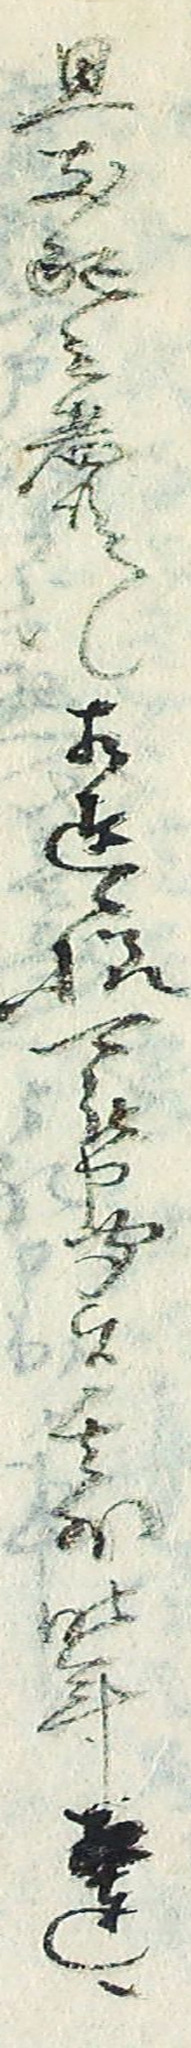且支配之者共へも相達候様可被申聞候其外昨年相達候
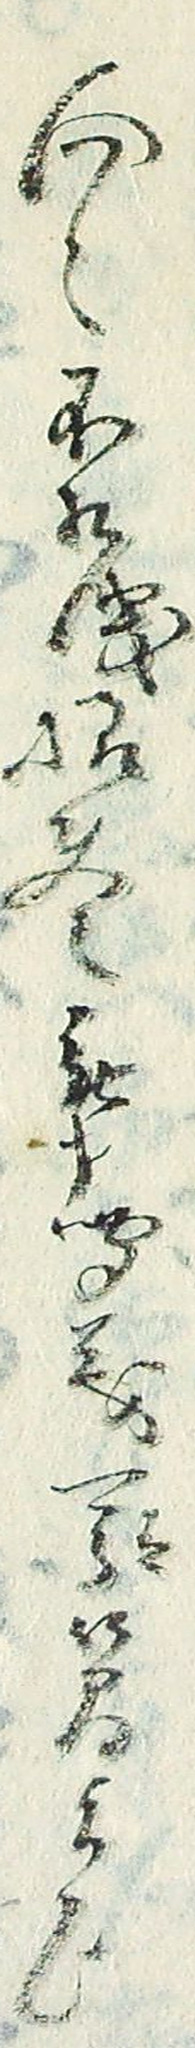向々不相洩様夫々被申聞義可有了簡候以上
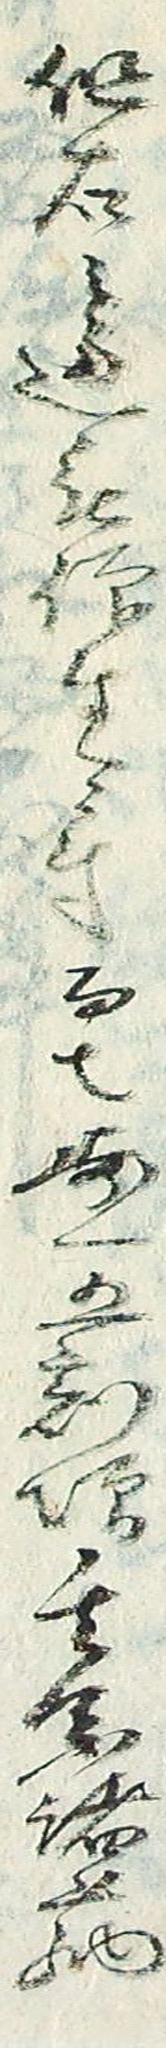但右之通被仰付候ニ付而者歩一五割増其余諸上納
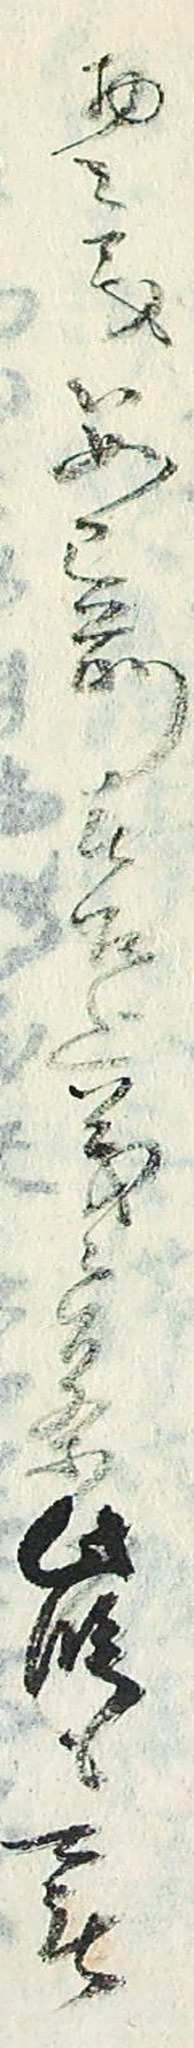物之義ハ如已前被召上義ニ候条此段も可被
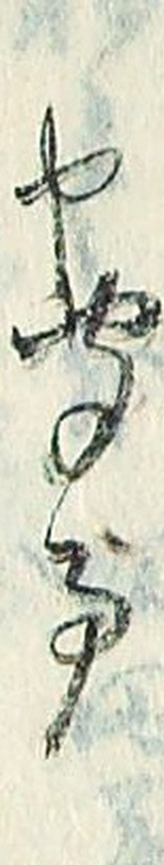申聞事
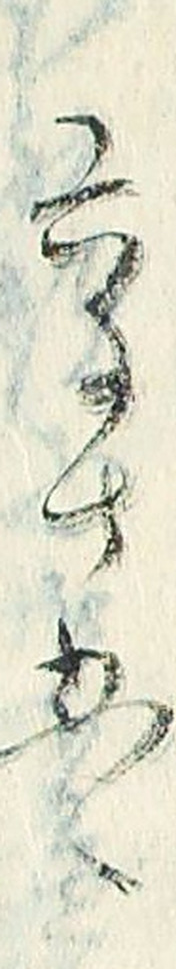六月十五日

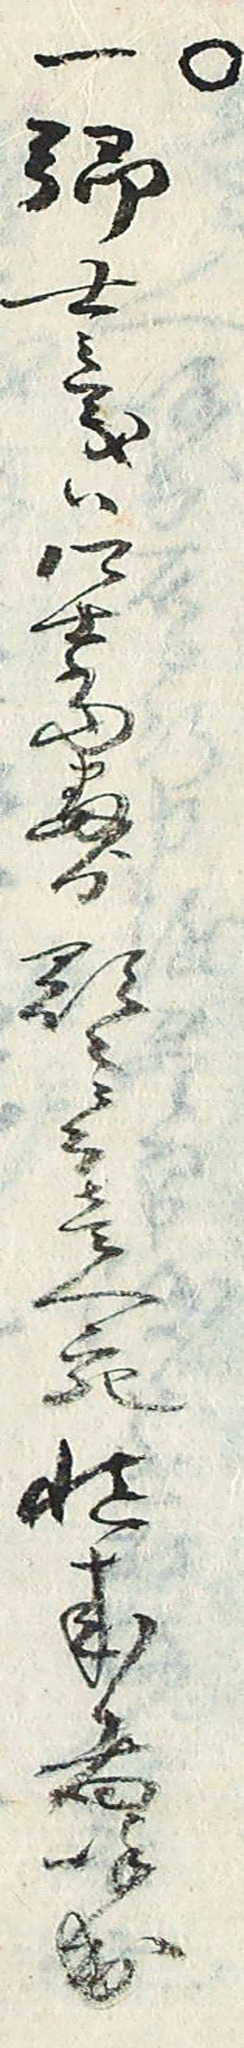一郷士之義ハ郷士當番ゟ郡々ニ而壱人宛慥成者呼出
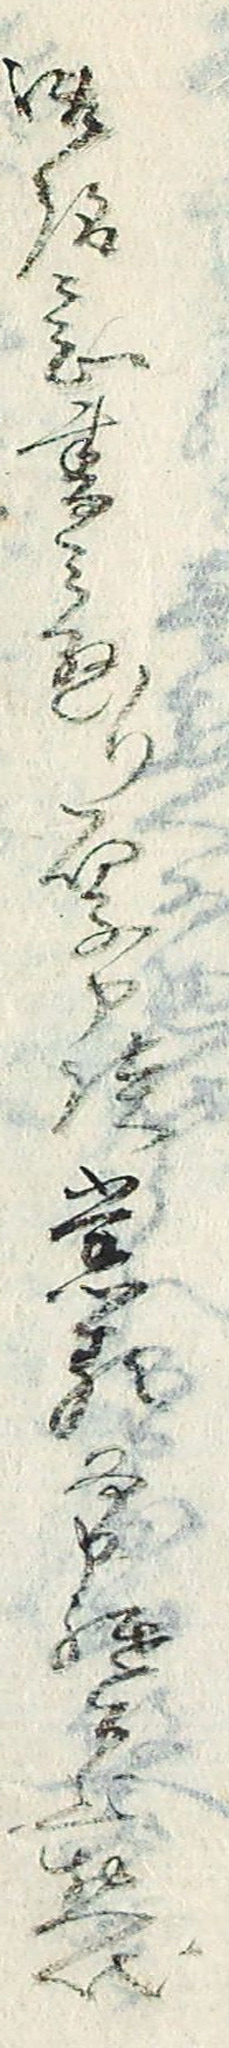御趣意書之懸り厚申談黨類為申継候上惣代
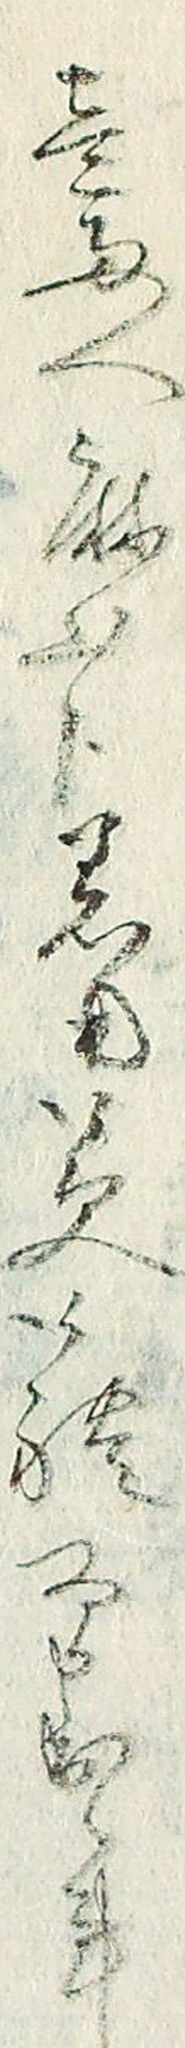壱両人麻上下着用御受御禮為申出候事
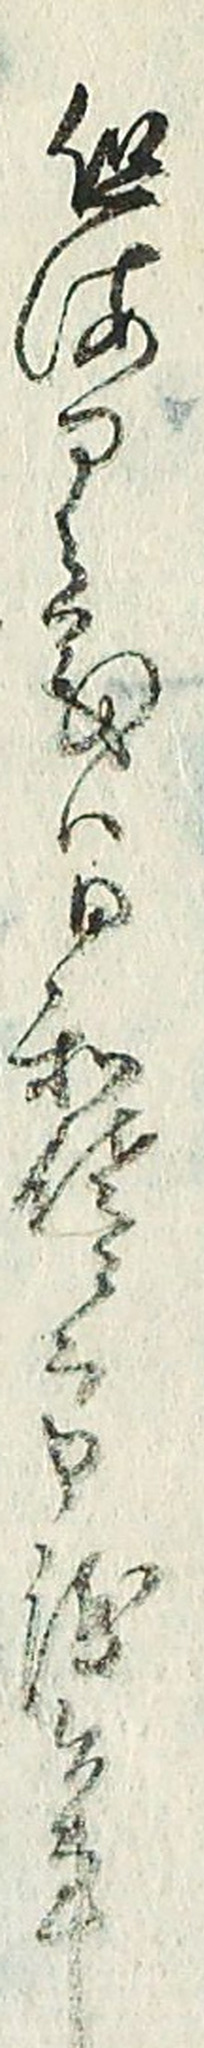但海部之義ハ日和佐ニ而申渡候事
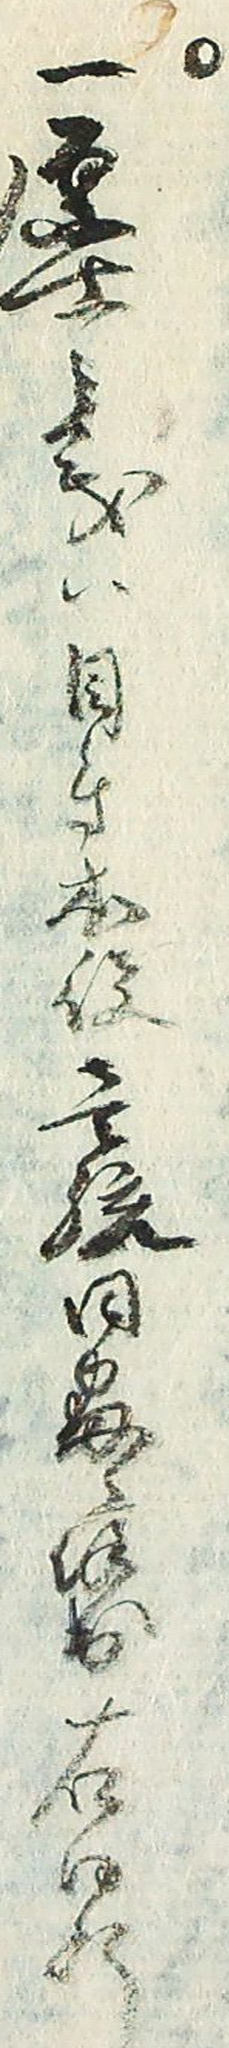一原士之義ハ目付本役壱統同番ニ呼出右同断
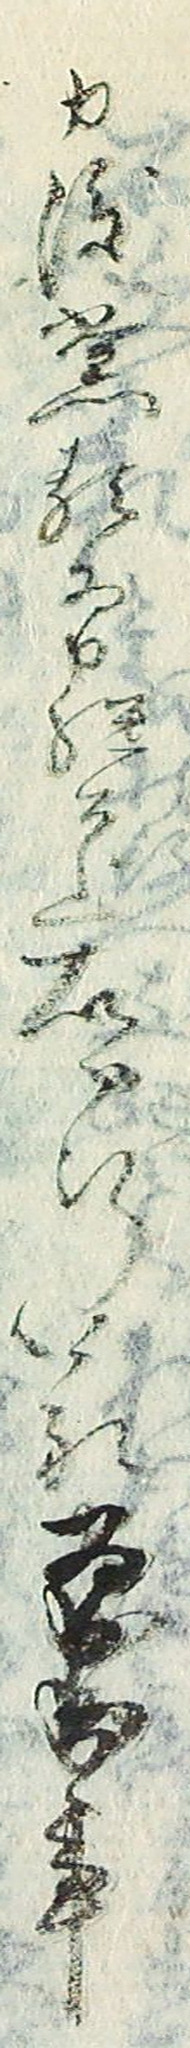申渡黨類為申継候上右同断御礼為申出候事
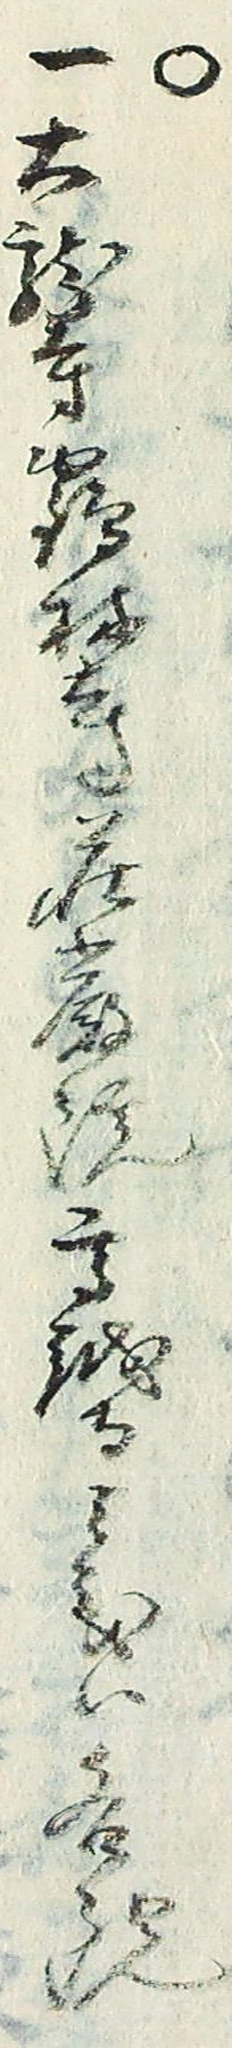一大龍寺鶴林寺荘厳院高誠寺之義ハ各院
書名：諸御趣意書并御下知向之写
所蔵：鳴門教育大学 Naruto University of Education
